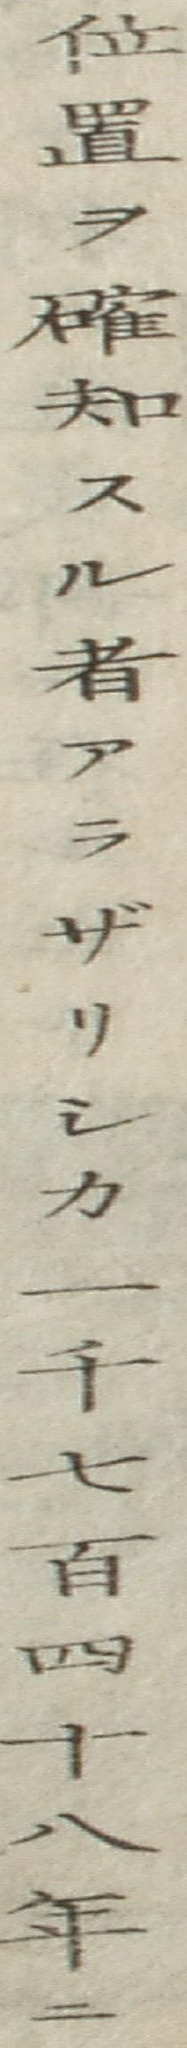位置ヲ確知スル者アラザリシカ一千七百四十八年ニ
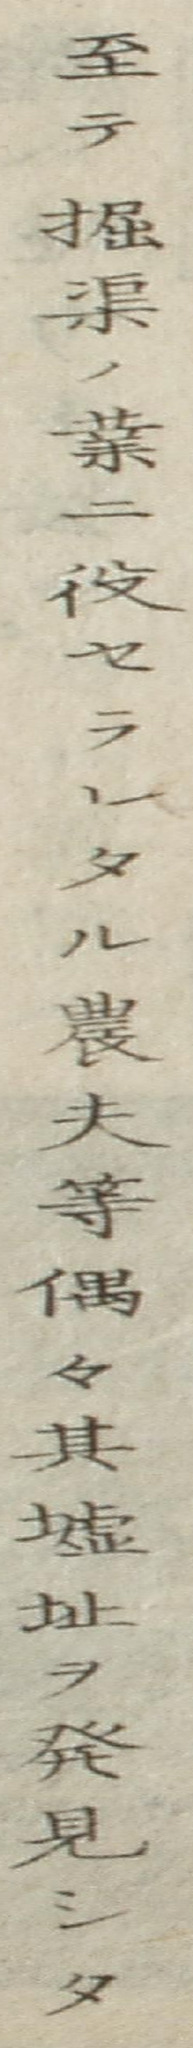至テ掘渠ノ業ニ役セラレタル農夫等隅々其墟址ヲ発見シタ
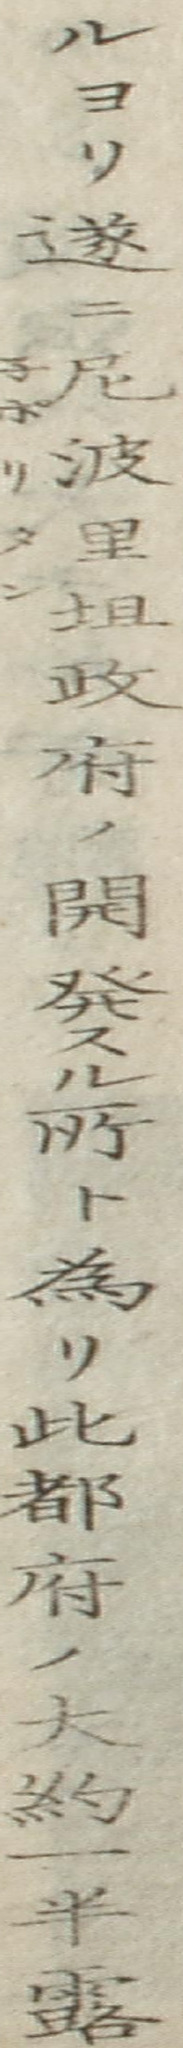ルヨリ遂ニ尼波里坦政府ノ開発スル所ト為リ此都府ノ大約一半露
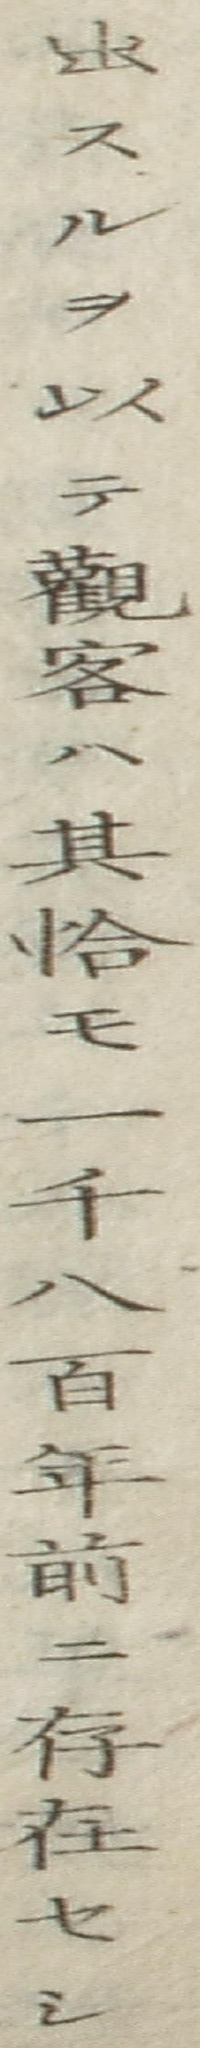出スルヲ以テ観客ハ其恰モ一千八百年前ニ存在セシ
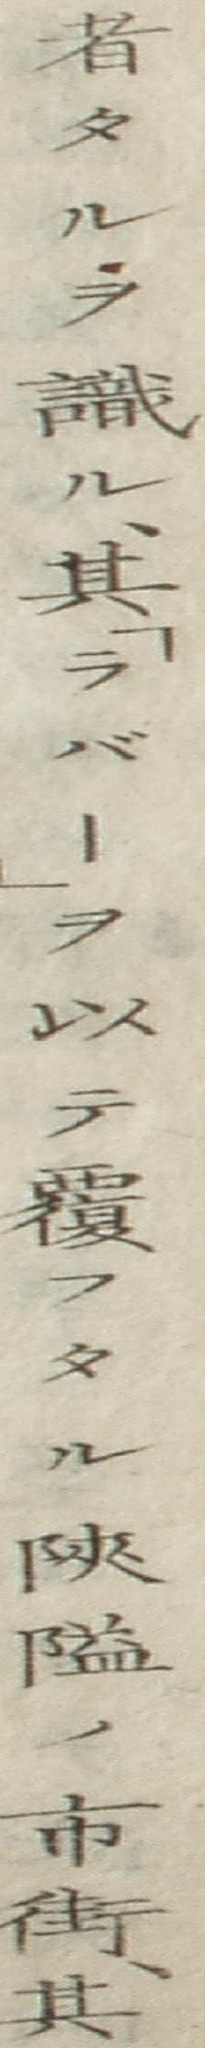者タルヲ識ル、其「ラバー」ヲ以テ覆フタル陜隘ノ市街、其
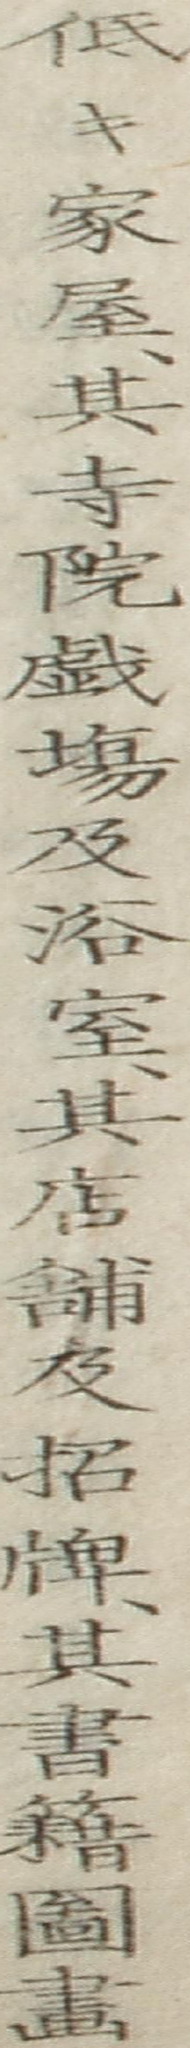低キ家屋、其寺院戯場及浴室、其店舗及招牌、其書籍図書
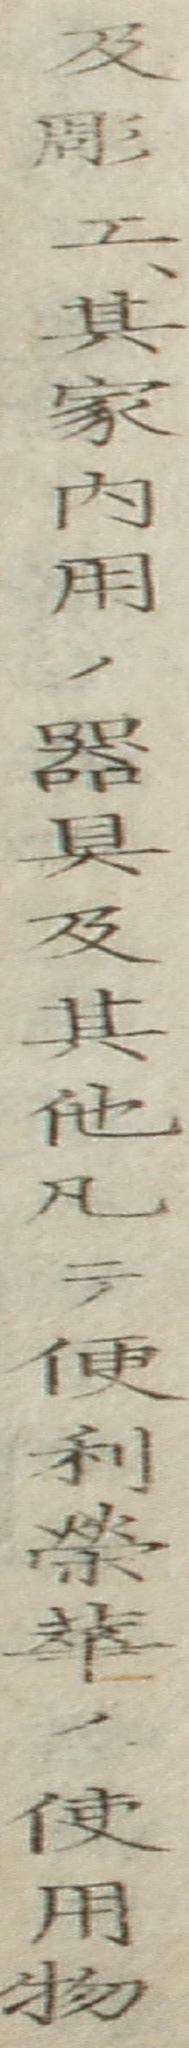及彫工、其家内用ノ器具及其他凡テ便利栄華ノ使用物

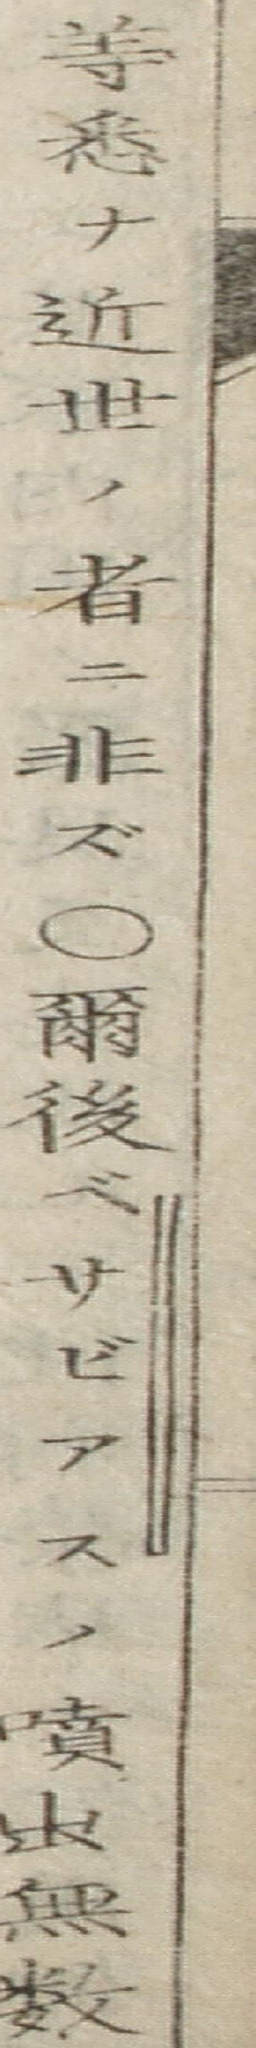等悉ナ近世ノ者ニ非ズ〇爾後ベサビアスノ噴出無数
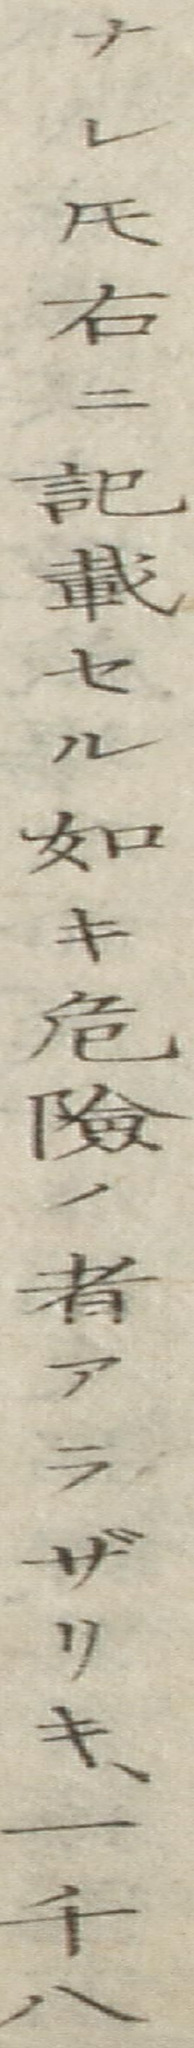ナレトモ右ニ記載セル如キ危険ノ者アラザリキ、一千八
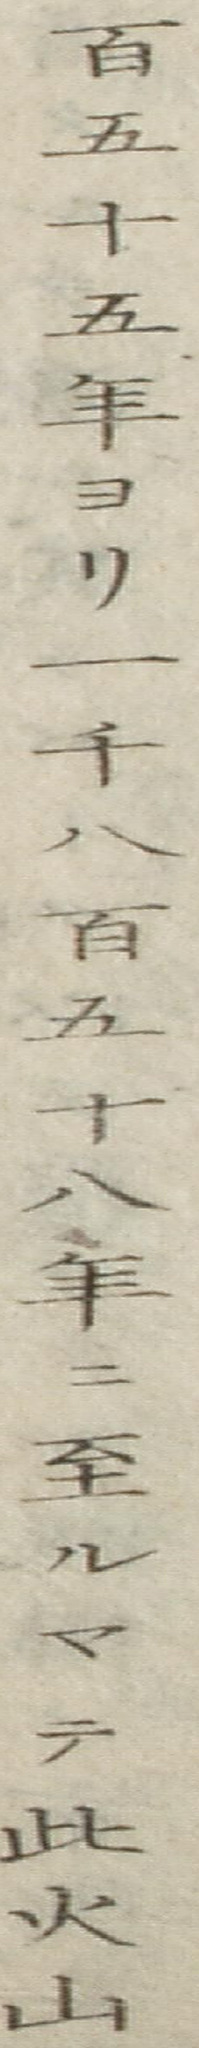百五十五年ヨリ一千八百五十八年ニ至ルマテ此火山
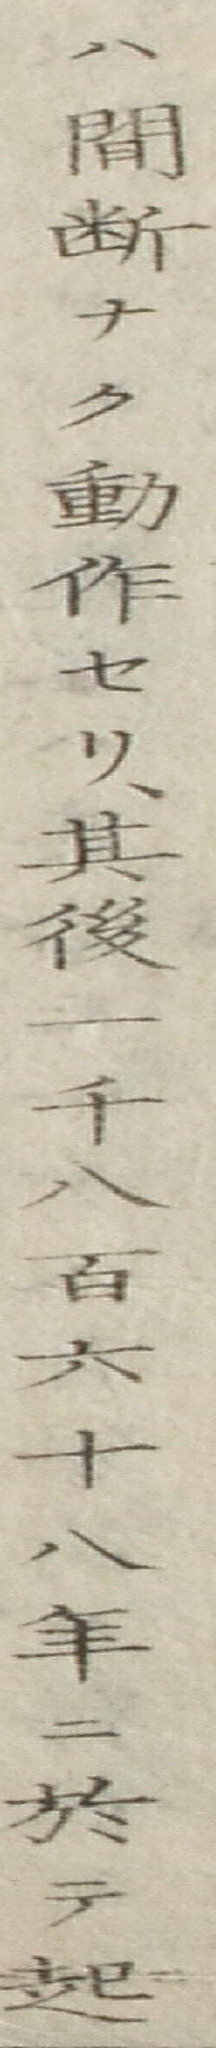ハ間断ナク動作セリ、其後一千八百六十八年ニ於テ起
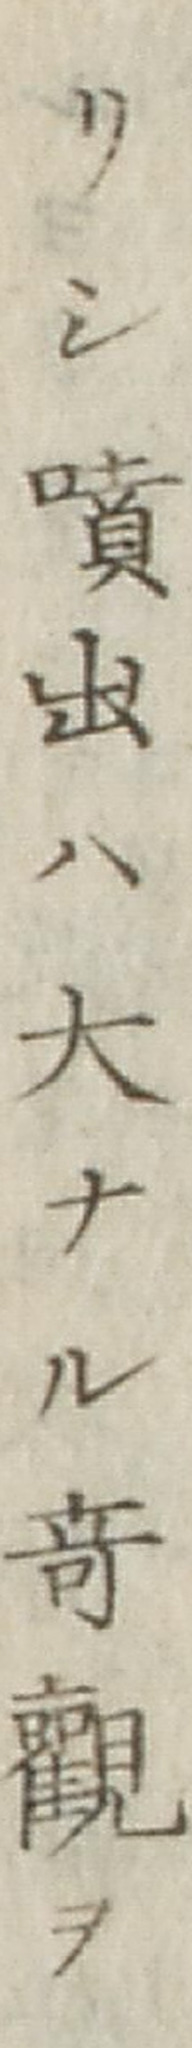リシ噴出ハ大ナル奇観ヲ
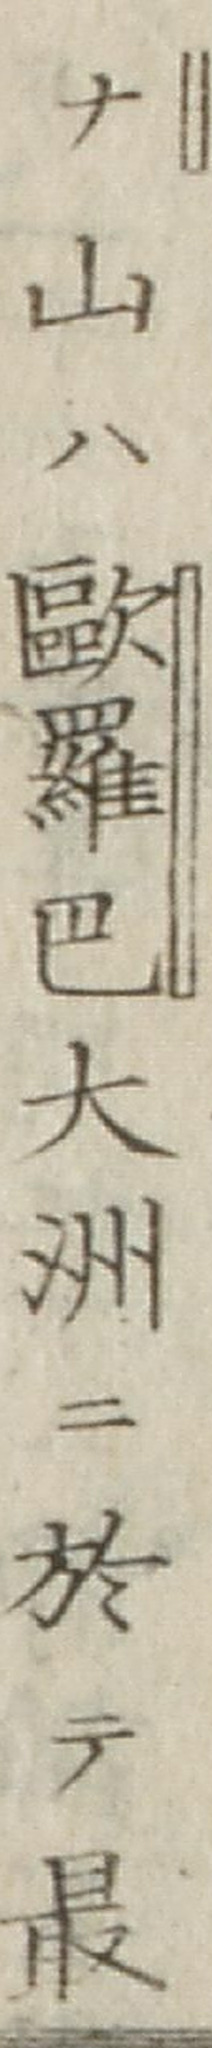ナ山ハ欧羅巴大洲ニ於テ最
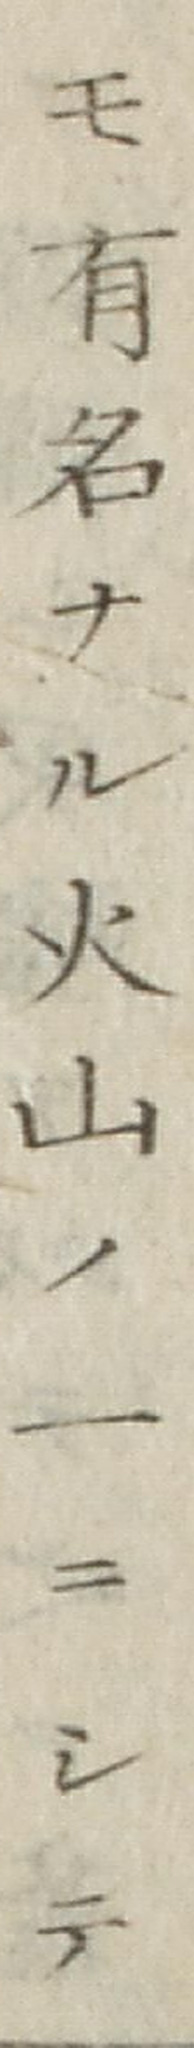モ有名ナル火山ノ一ニシテ
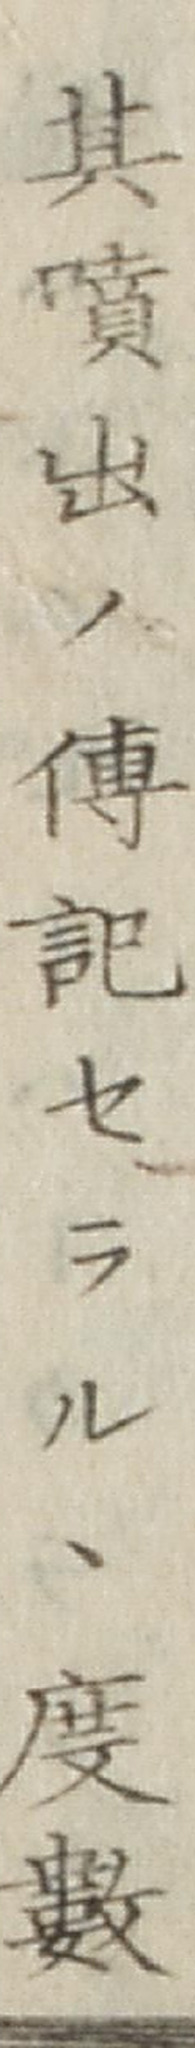其噴出ノ傳記セラルヽ度数
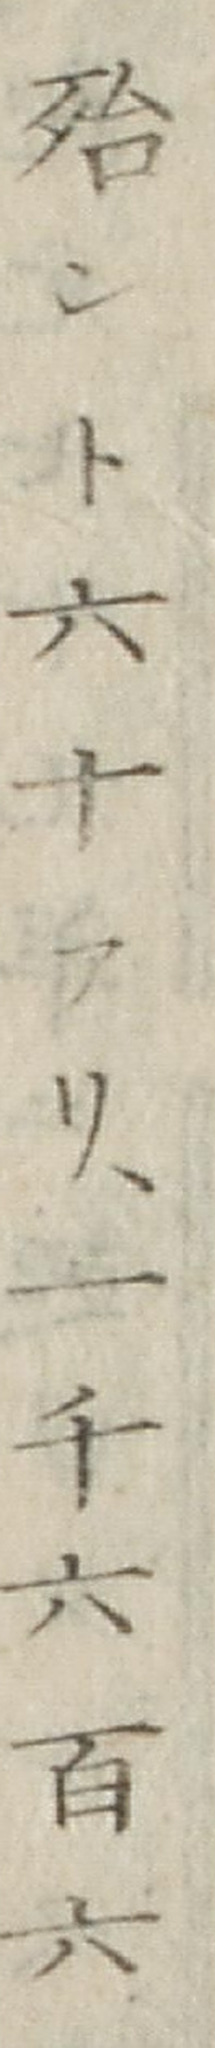殆ント六十アリ、一千六百六
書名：地形論　巻二
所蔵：東京大学地震研究所図書室 Earthquake Research Institute Library, The University of Tokyo, JAPAN
